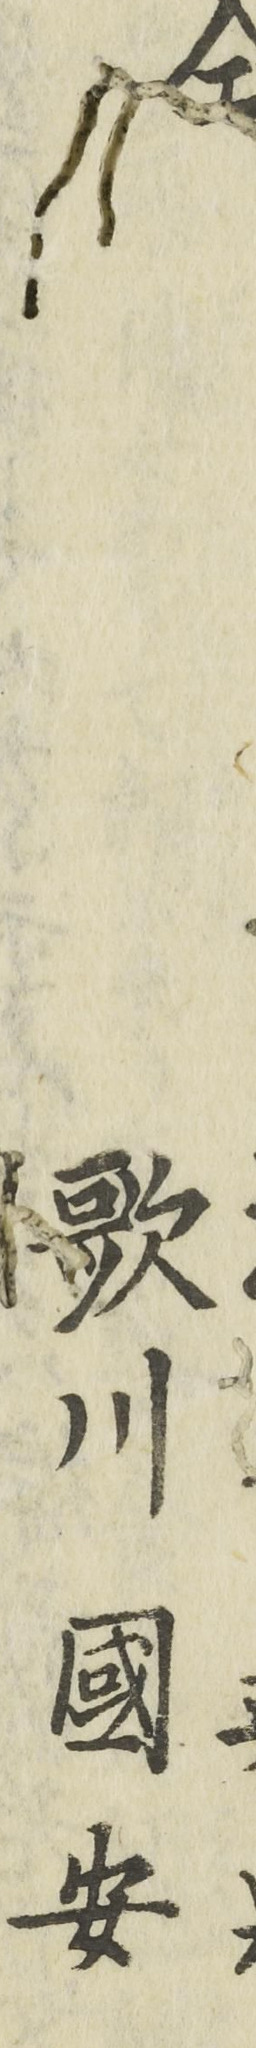歌川国安
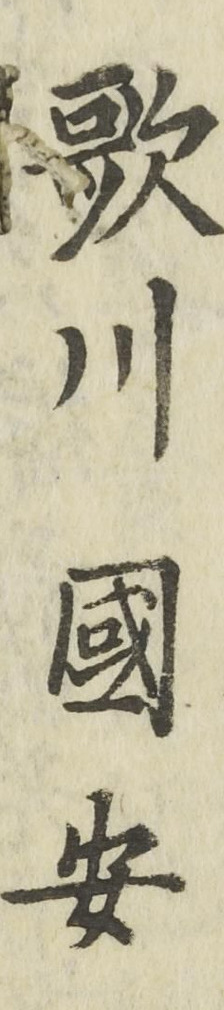歌川国安
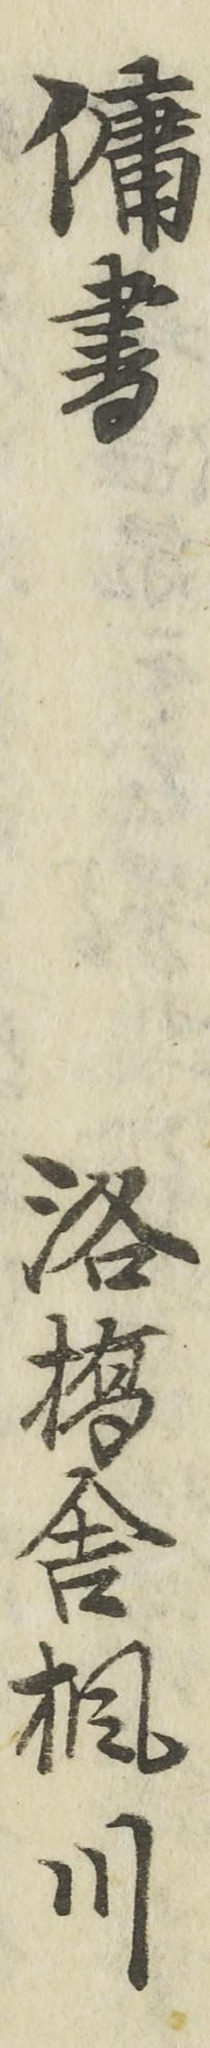傭書洛橋舎楓川
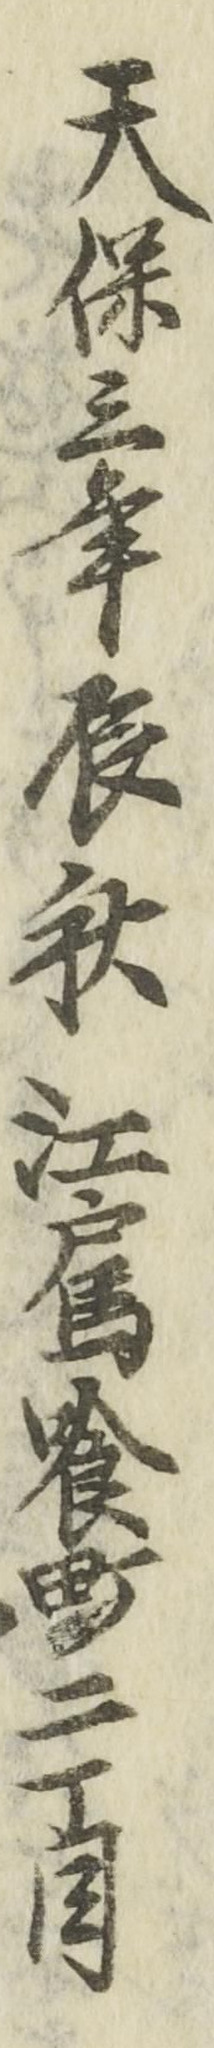天保三年辰秋江戸馬喰町二丁目
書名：熱海温泉圖彙
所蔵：東京大学地震研究所図書室 Earthquake Research Institute Library, The University of Tokyo, JAPAN
